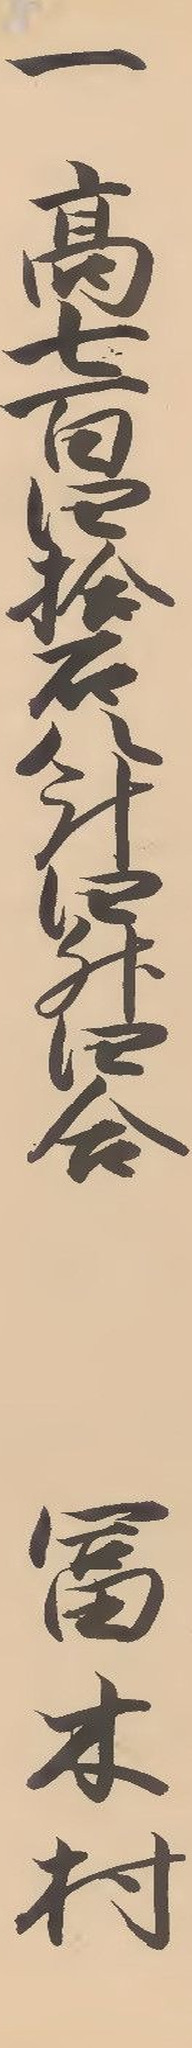一高七百四拾石八斗四升四合富木村
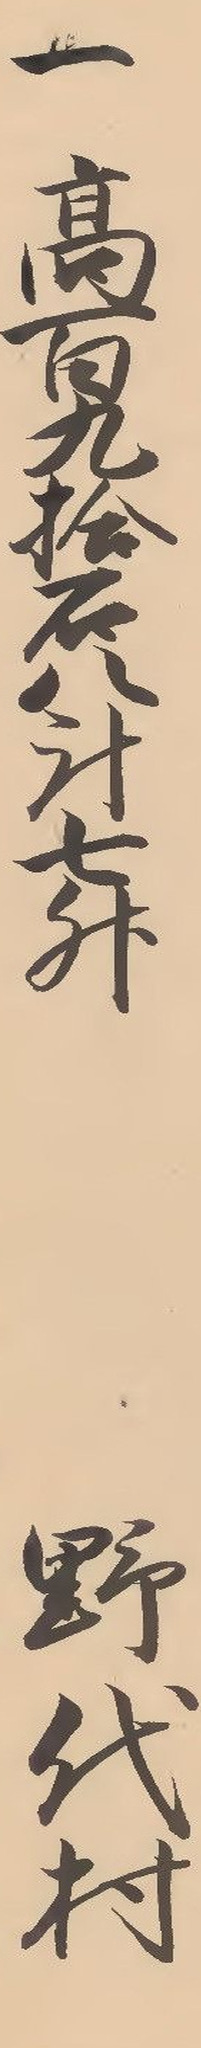一高百九拾石八斗七升野代村

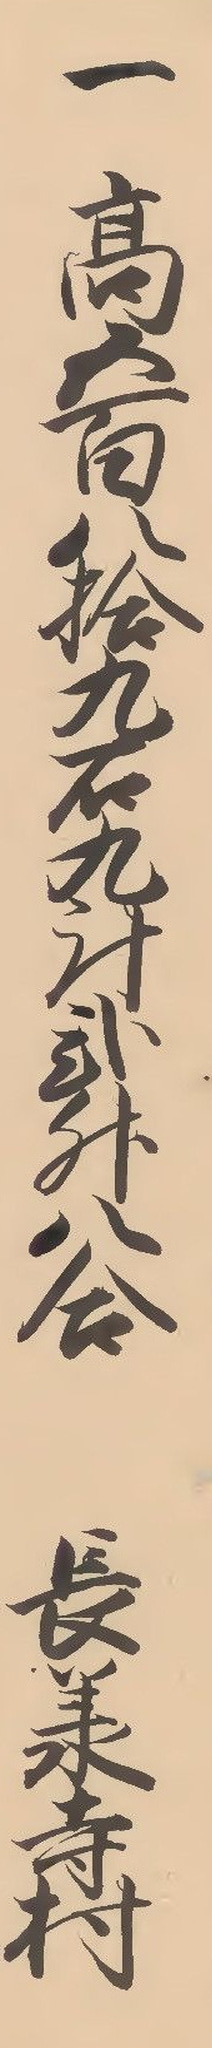一高五百八拾九石九斗弐升八合長承寺村
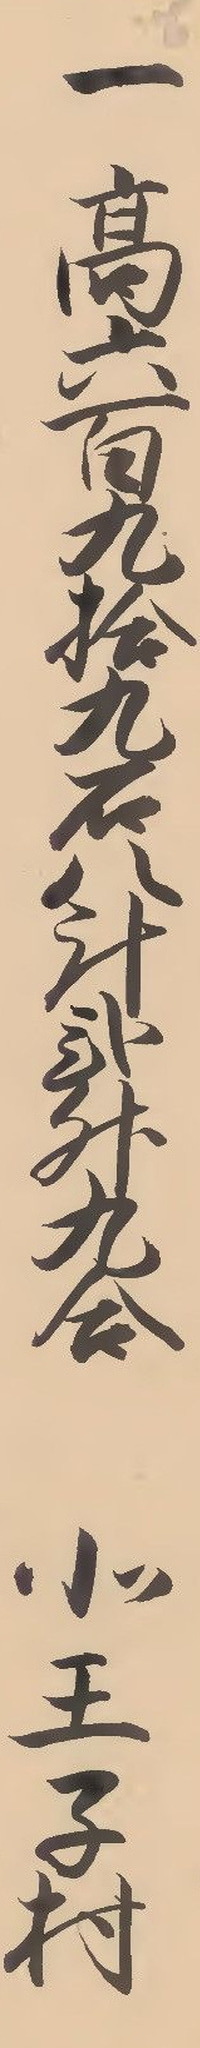一高六百九拾九石八斗弐升九合北王子村
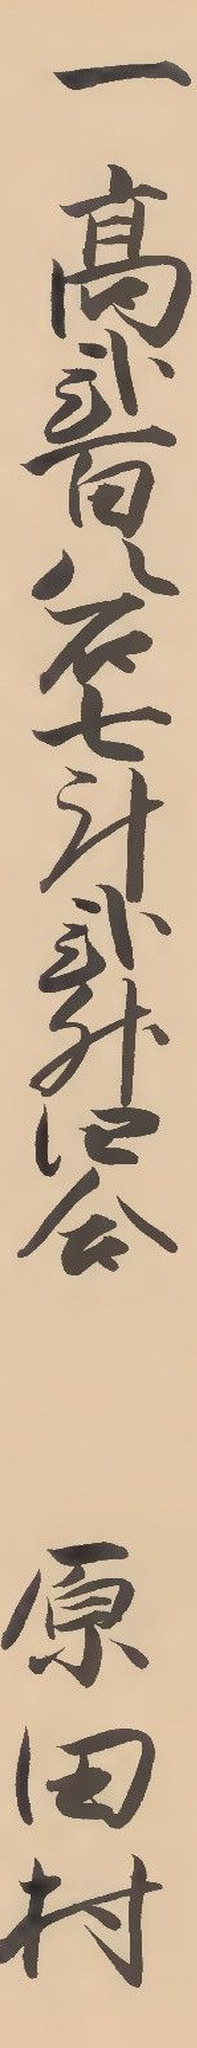一高弐百八石七斗弐升四合原田村
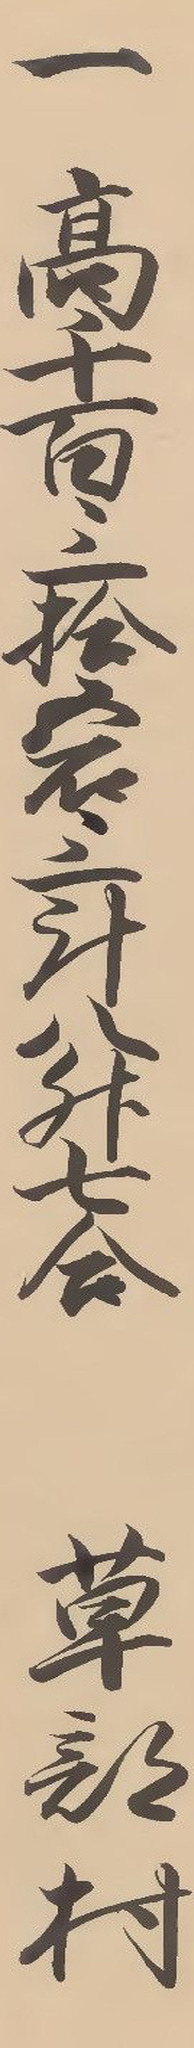一高千百三拾五石三斗八升七合草部村
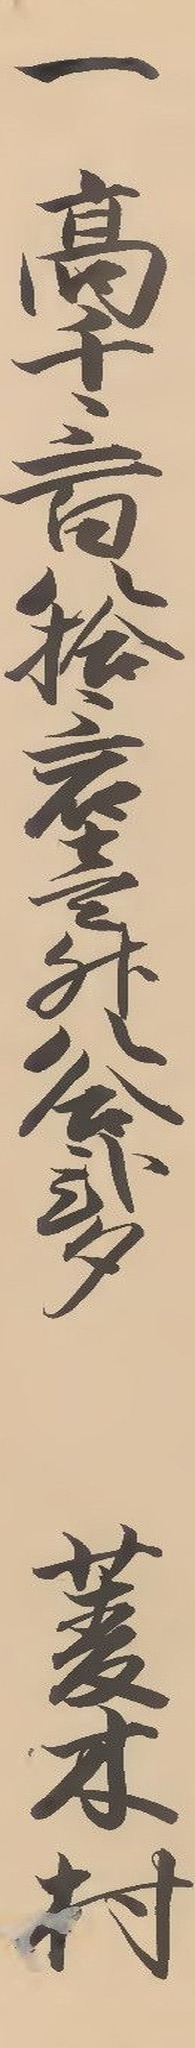一高千三百八拾三石壱升八合弐勺菱木村
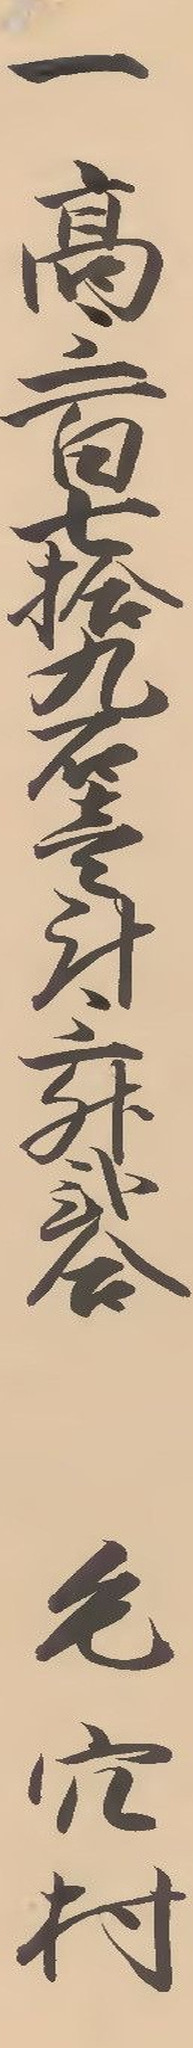一高三百七拾九石壱斗三升弐合毛穴村
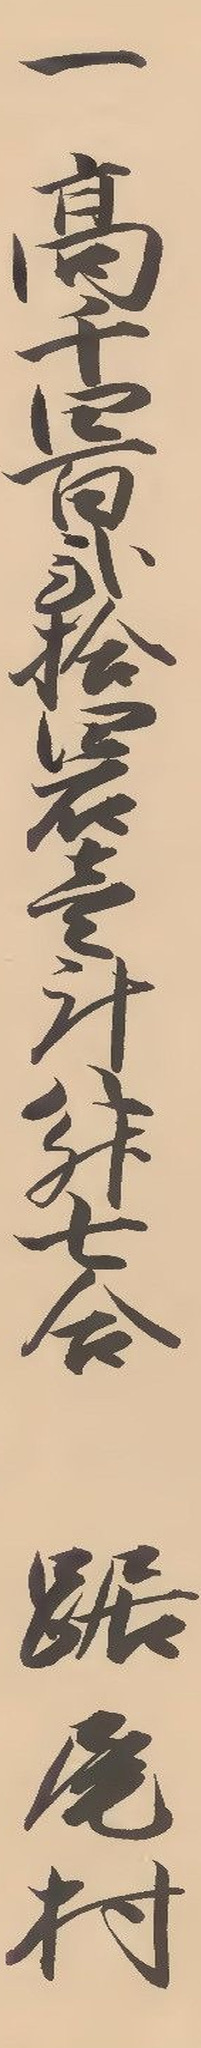一高千四百弐拾四石壱斗八升七合踞尾村

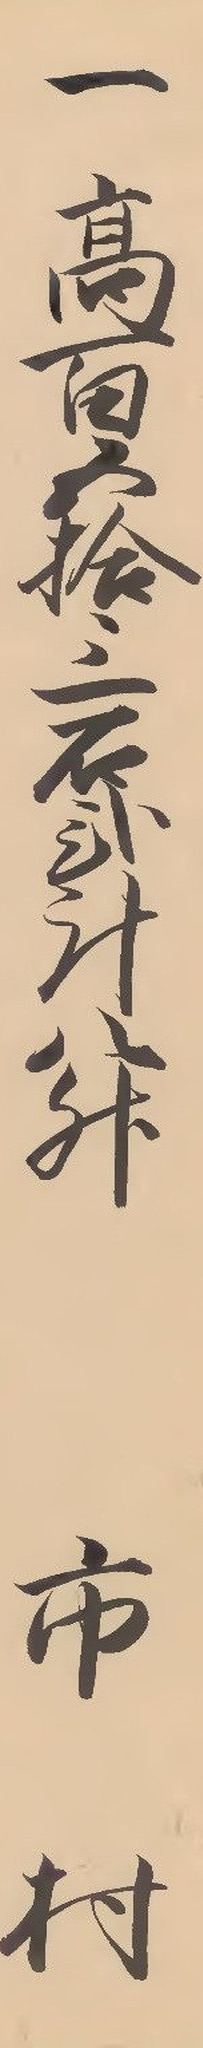一高百五拾三石弐斗八升市村
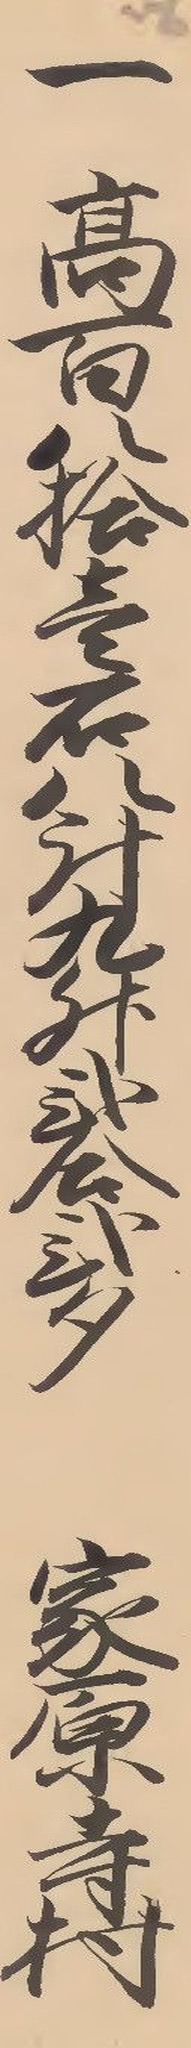一高百八拾壱石八斗九升弐合弐勺家原寺村
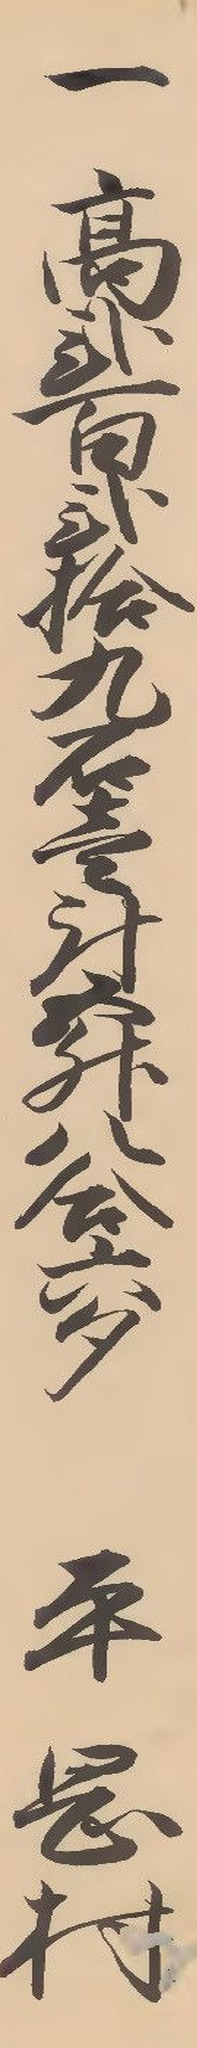一高弐百弐拾九石壱斗五升八合六勺平岡村
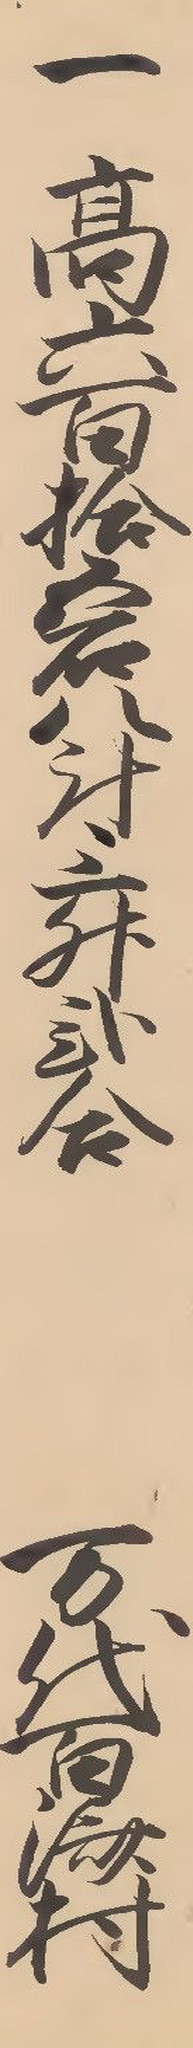一高六百拾五石八斗三升弐合万代百済村
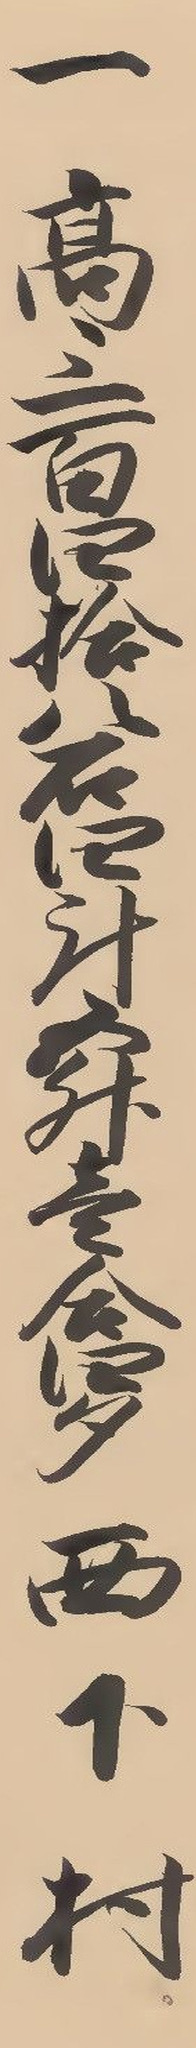一高三百四拾八石四斗五升壱合四勺西下村
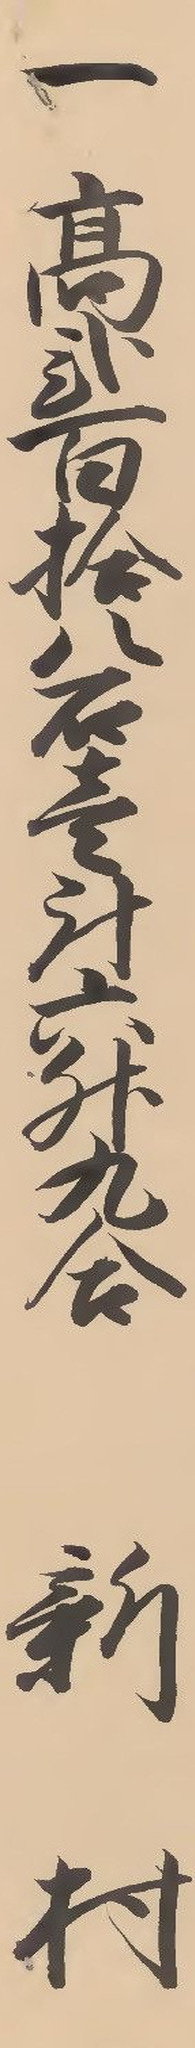一高弐百拾八石壱斗六升九合新村
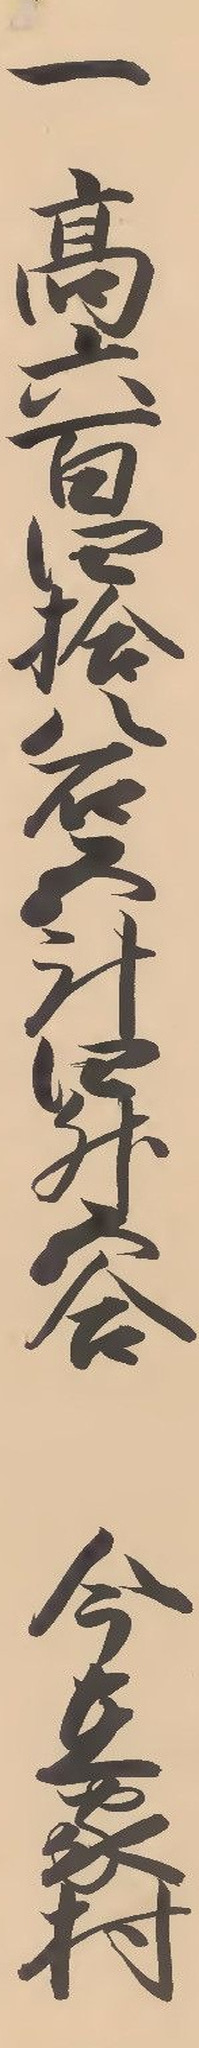一高六百四拾八石五斗四升五合今在家村
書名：和泉国郷帳
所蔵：国立公文書館 National Archives of Japan
